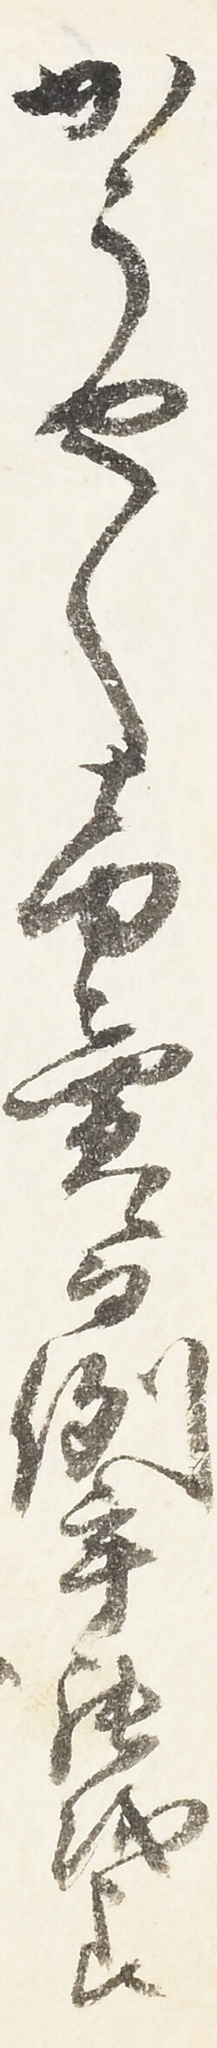かうやく商売ニ而例年罷越申候
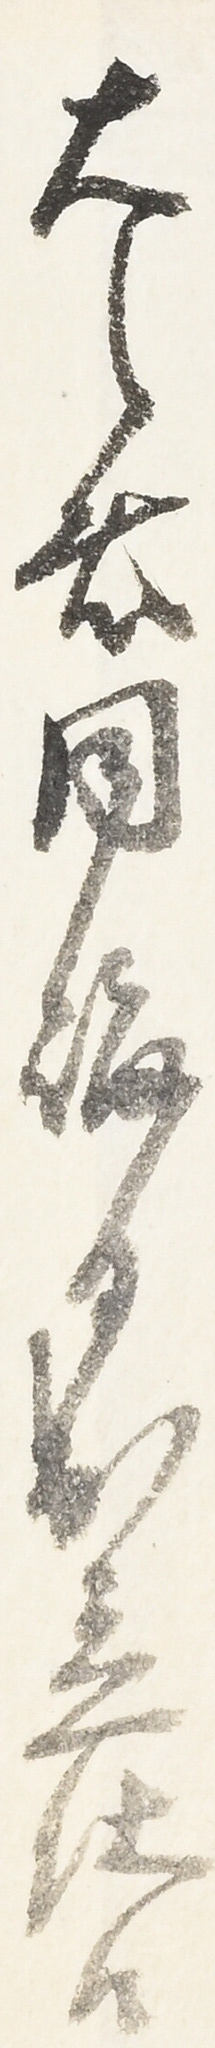右之者同晦日出立仕候
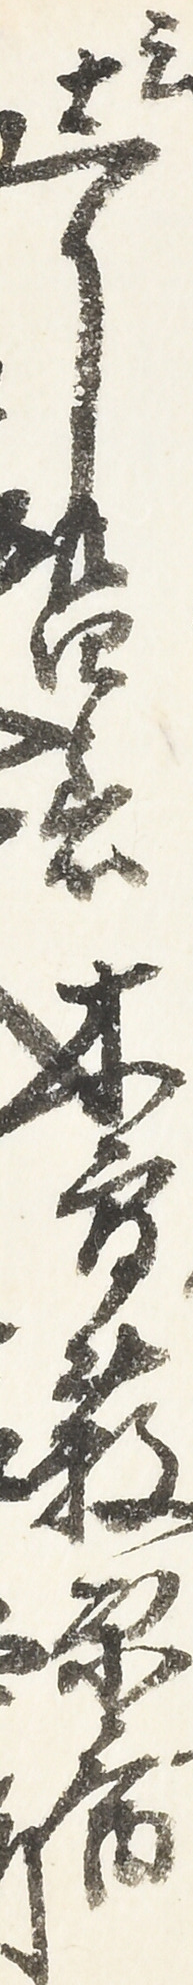十二月廿四日着木曽藪原宿
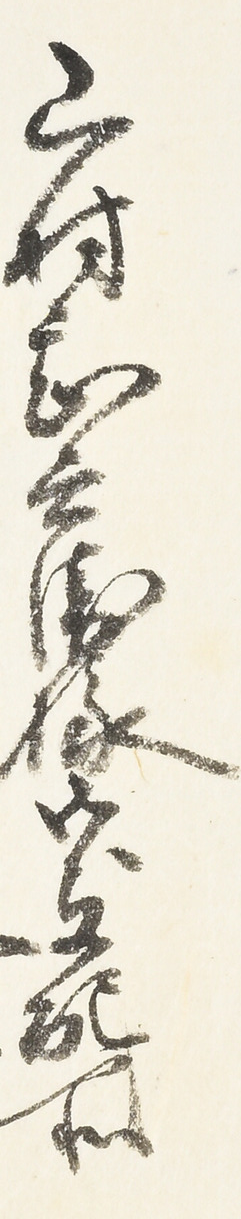山村甚兵衛様御支配所
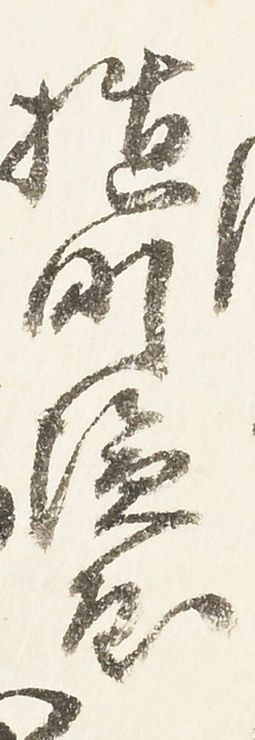横町塩屋
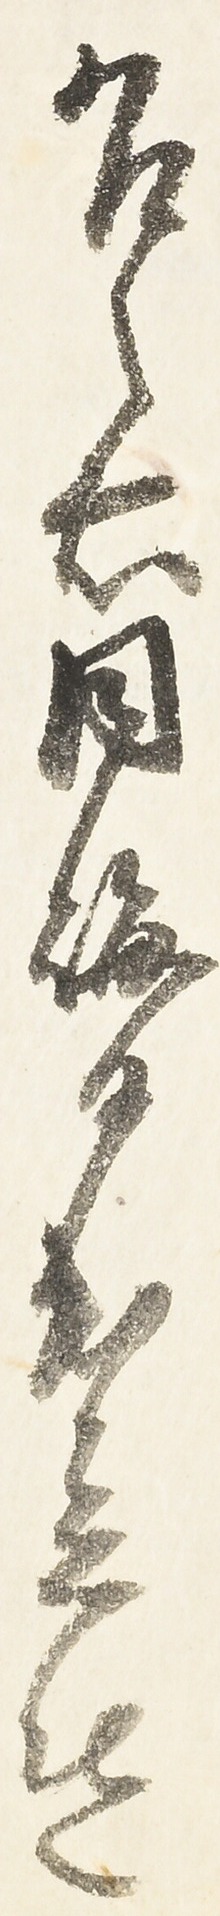右之者同晦日出立仕候
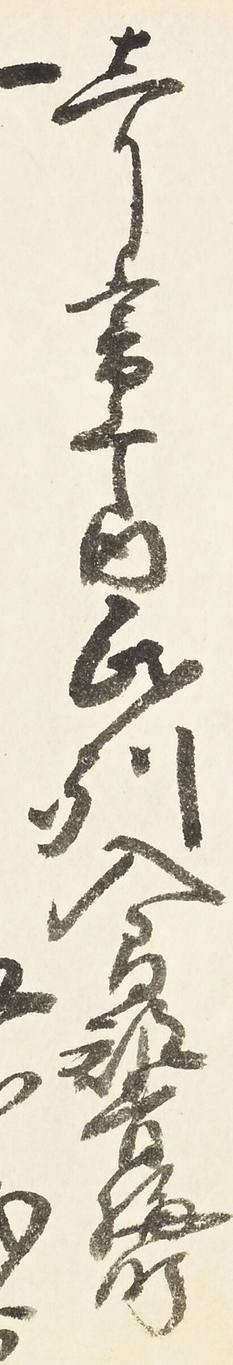十二月書上之内武州入間郡青梅町
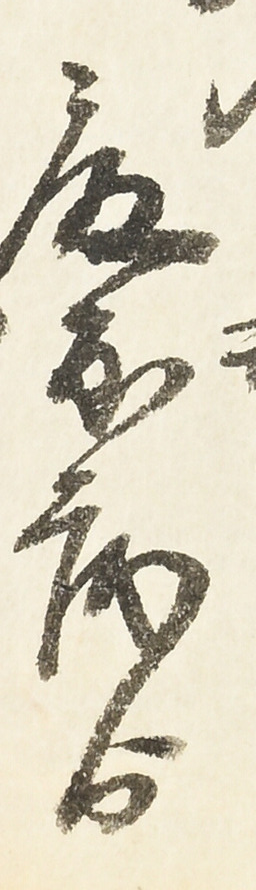一藤屋茂衛門
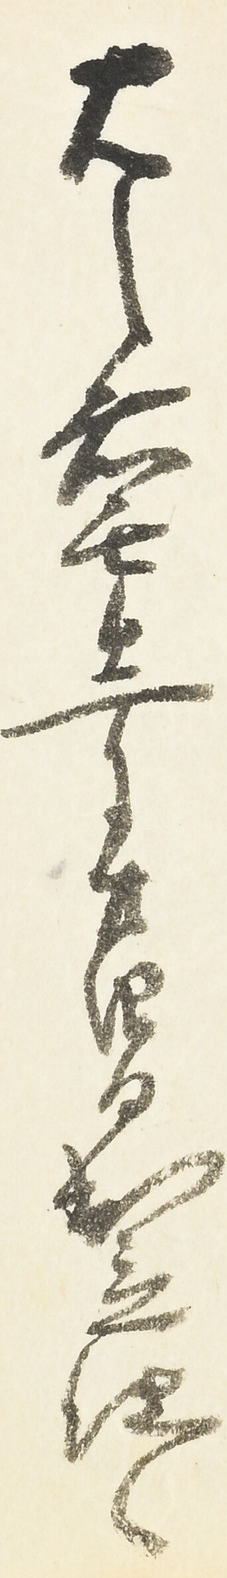右之者壬十二月廿四日出立仕候
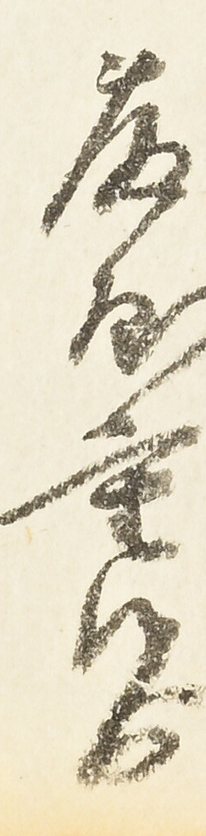藤屋重左衛門
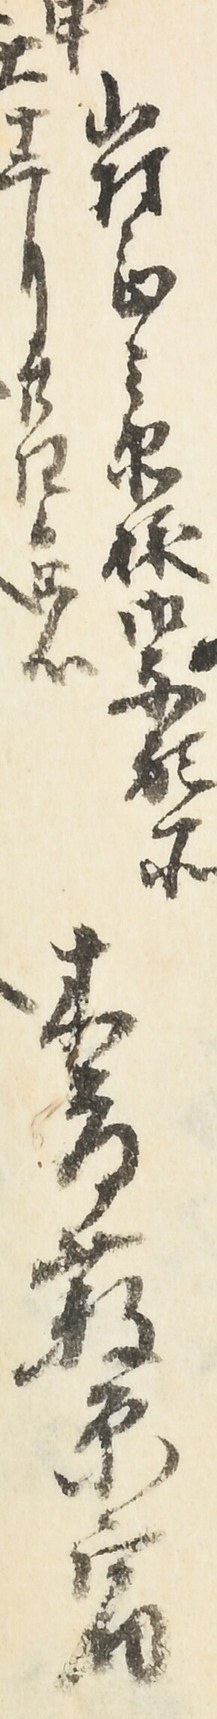山村甚兵衛様御支配所
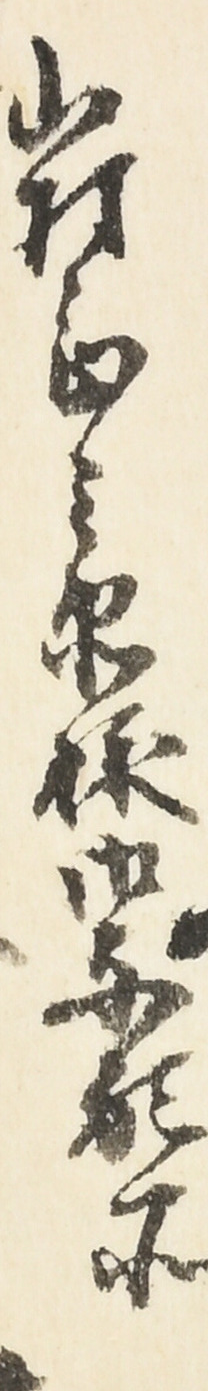山村甚兵衛様御支配所

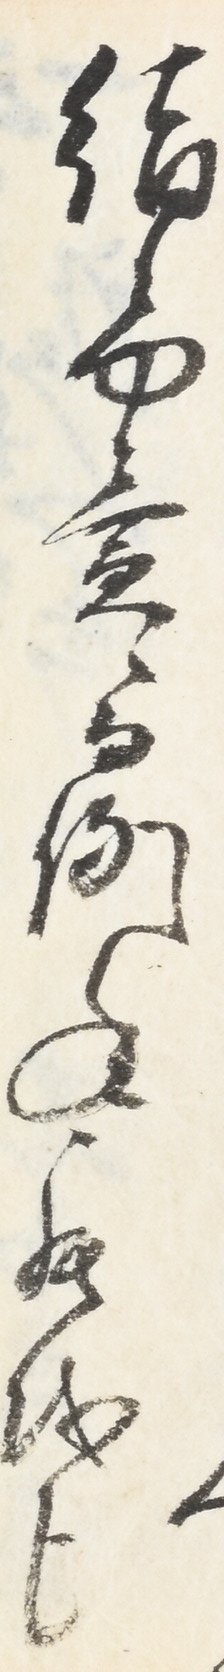形商売ニ而例年罷越申候
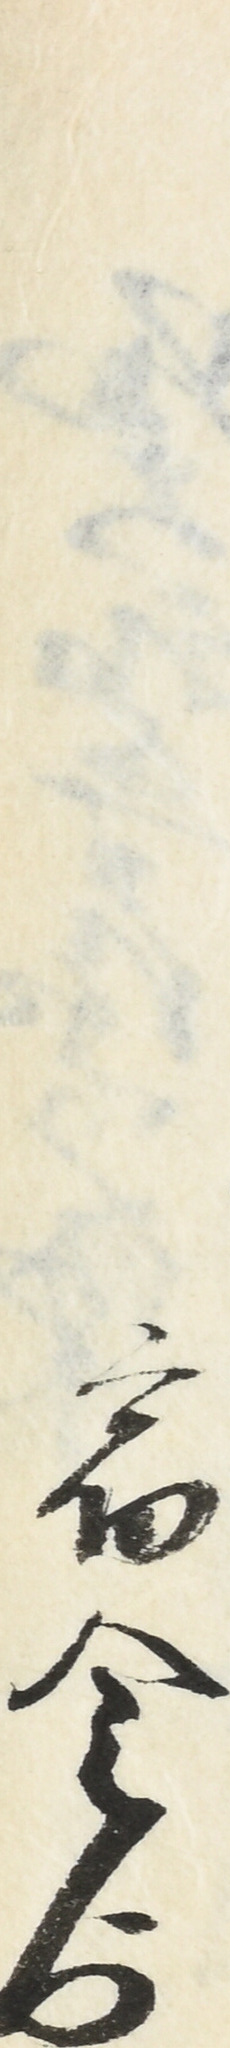宿久右衛門
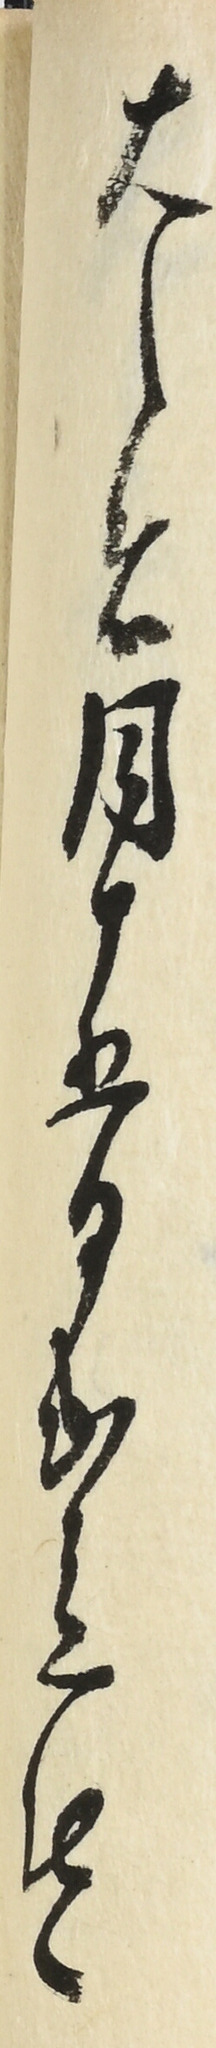右之者同十九日出立仕候
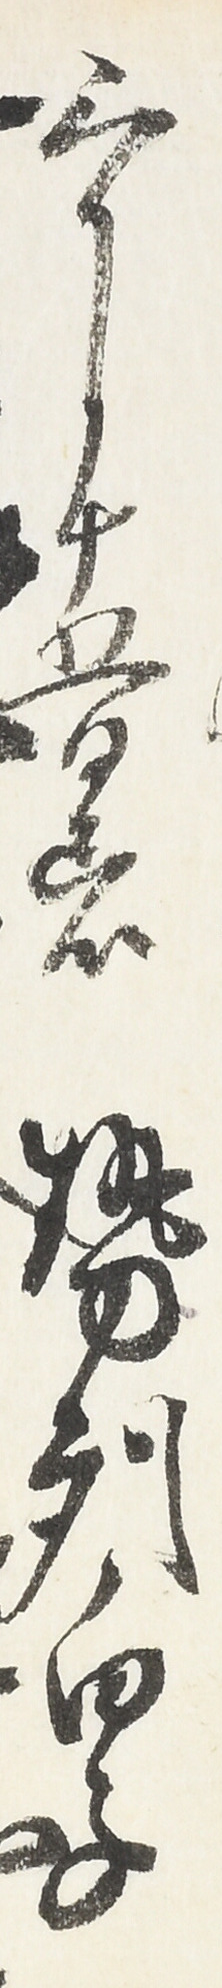三月十五日着勢州白子
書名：町中旅人泊控帳
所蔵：伊那市立高遠町図書館・合同会社AMANE
